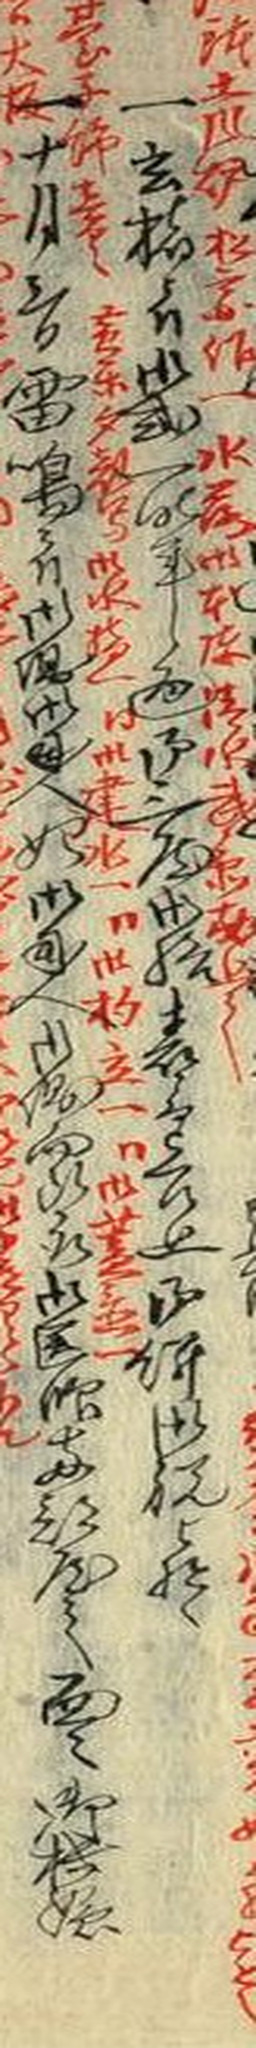一十月三日雷鳴ニ付御側御用人始御用人御側向頭取御医師両部屋之面々御機嫌
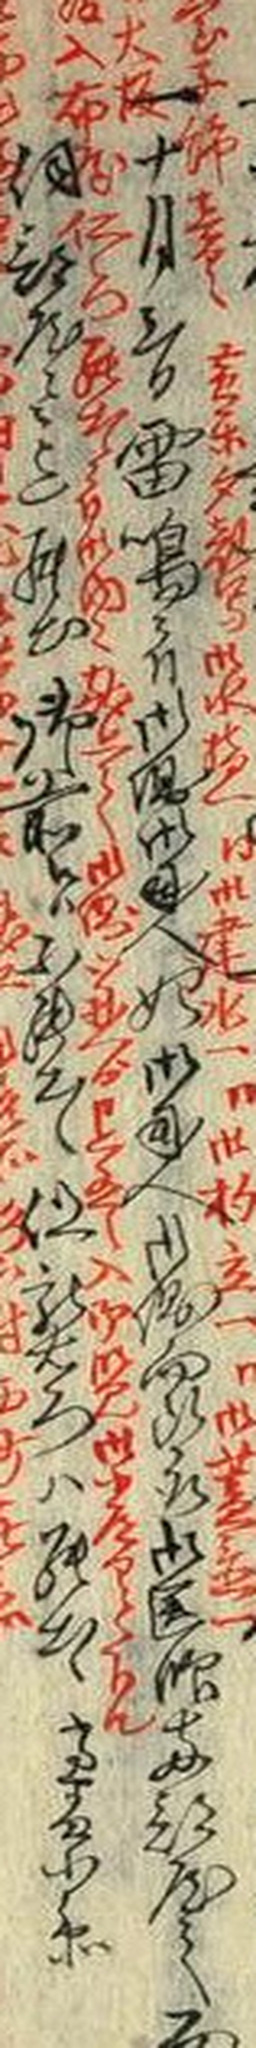伺部屋々々迄罷出御前江ハ不罷出候但新右衛門ハ罷出候当番小兵衛
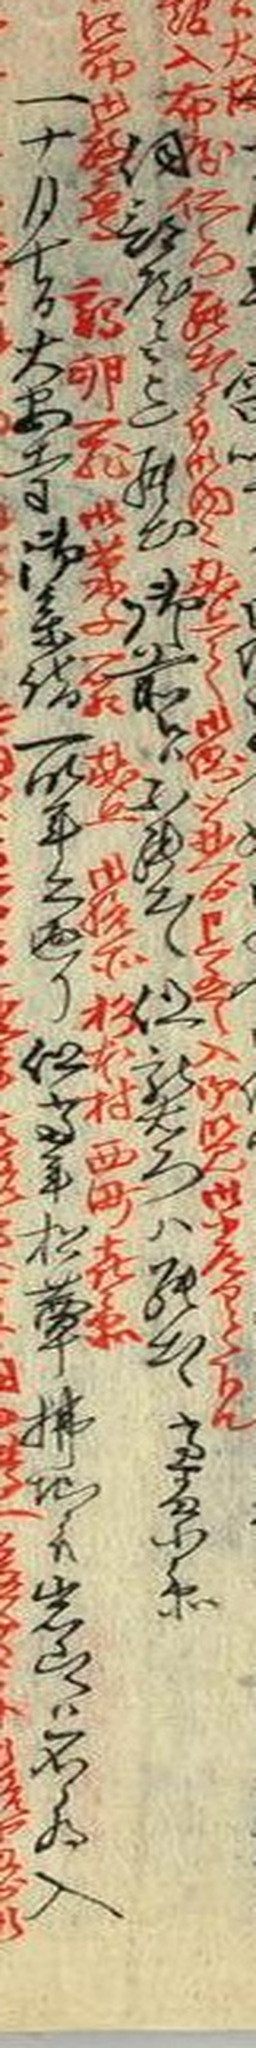一十月七日大安寺御参詣一昨年之通り但当年松蕈仏地ニ付岩山へハ不被為入
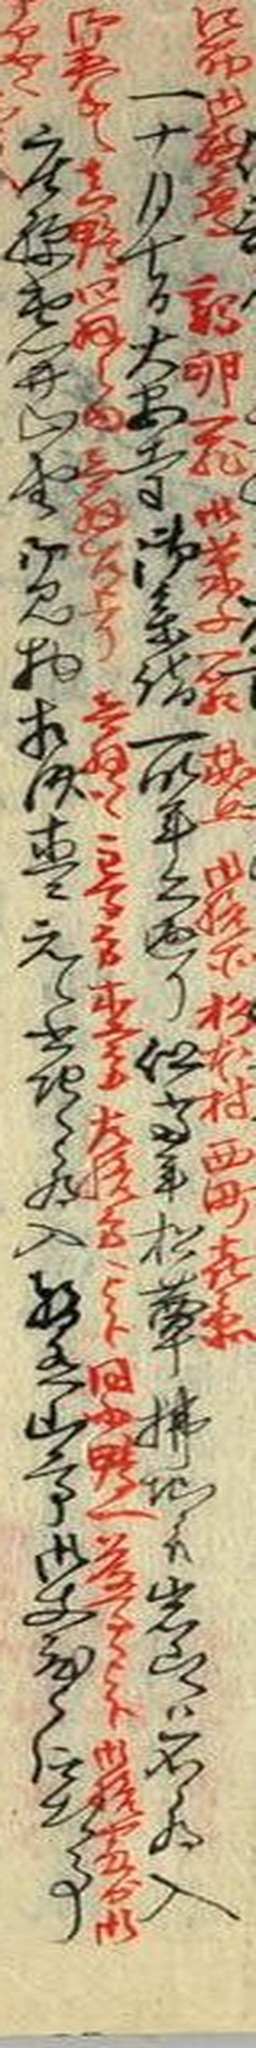座禅堂開山堂御見物相済直ニ元之書院へ被為入暫有山亭御支度被仰出候事
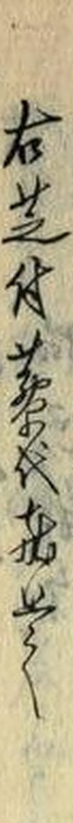右芝付蕈代献上之
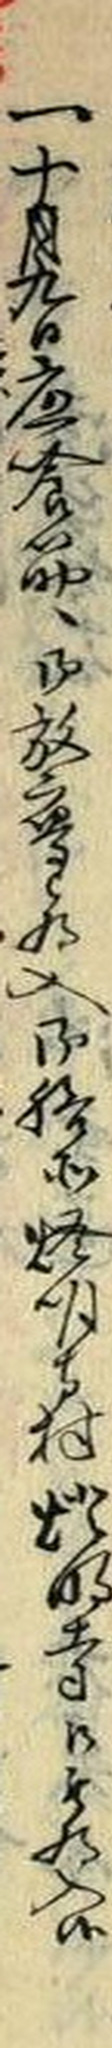一十月九日底喰筋へ御放鷹被為入御膳所燈明寺村燈明寺江被為入候
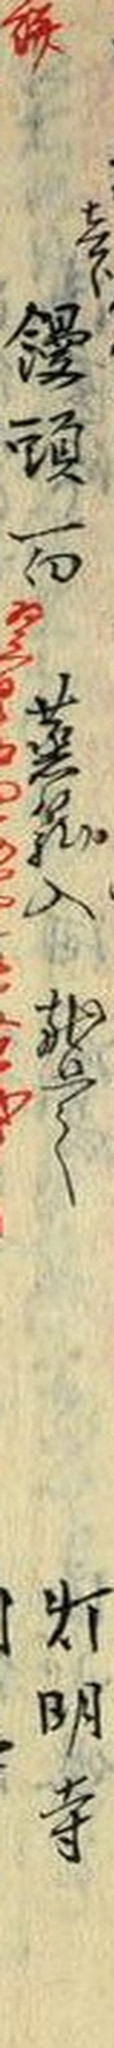壱饅頭百蒸籠入献上之燈明寺
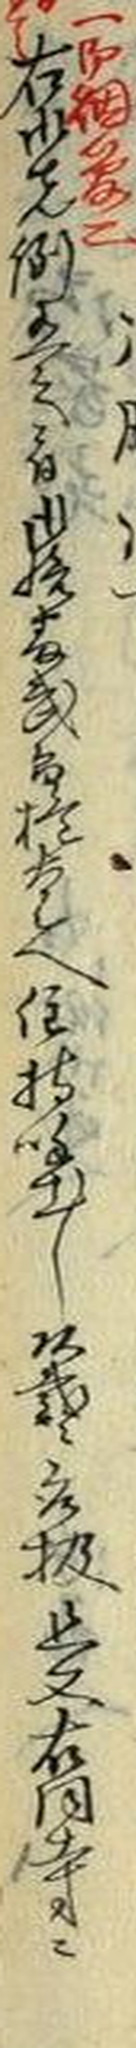右御先例有之ニ付御膳番武曾権太夫住持呼出し頂戴ニ取扱且又右同寺ニ
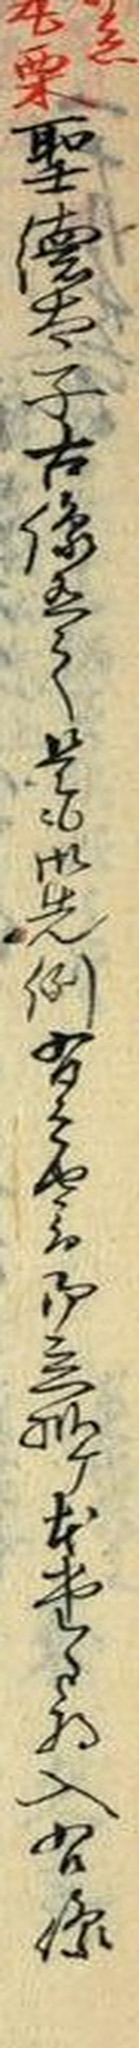聖徳太子古像有之是も御先例有之由ニ而御立掛ケ本堂へ被為入右像
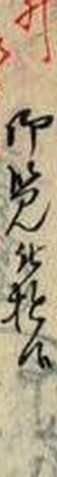御覧被遊候
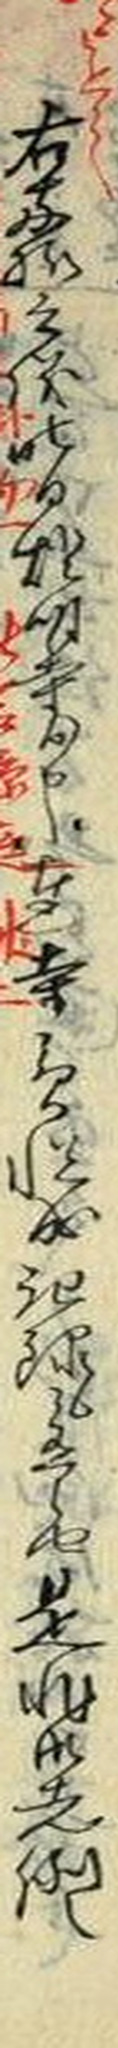右両様之儀昨日燈明寺ゟ申達寺ニ而ハ慥成記録も有之由是非御先例之
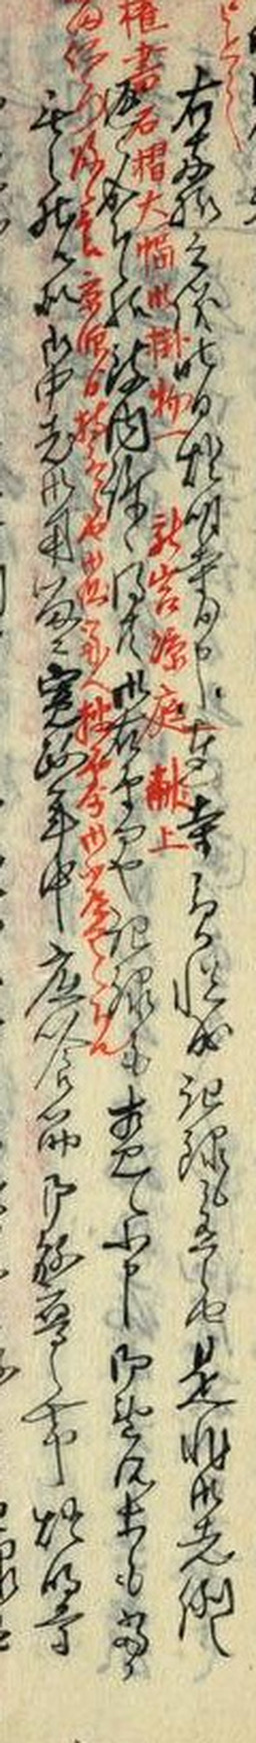通被成下候様致内訴候得共御右筆部や記録ニも相見不申御台所等も当り
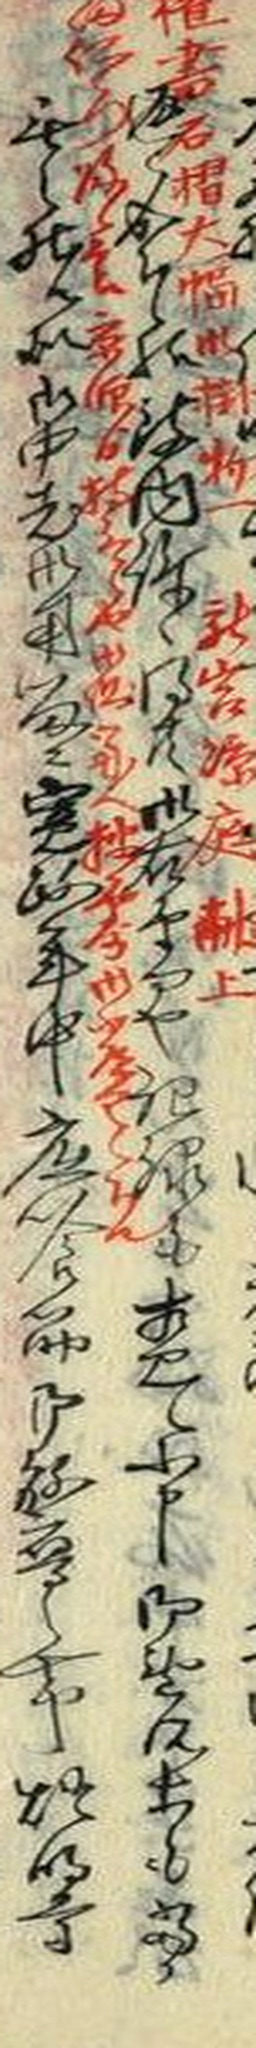無之然ル処御中老御用留ニ寛政年中底喰筋御放鷹之節燈明寺
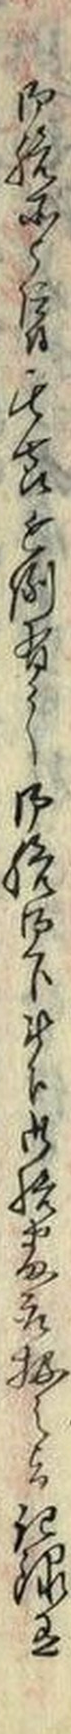御膳所被仰付其節近例有之御膳御下被下御膳番取扱之旨記録有
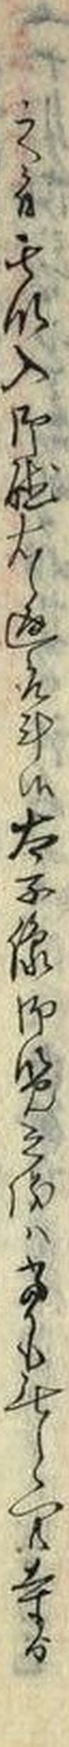之ニ付其段入御聴右之通取計候太子像御覧之儀ハ当りも無之候へ共寺ゟ
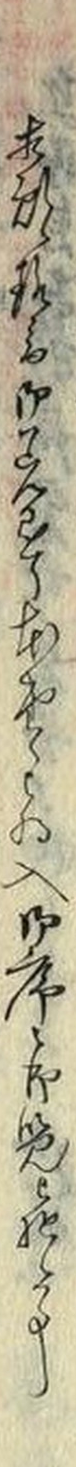相願候趣ニ而御差懸り本堂へ被為入御序ニ御覧被遊候事
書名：少傅日録抄（斉承付側向頭取日記、在国）
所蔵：福井県文書館 Fukui Prefectural Archives
